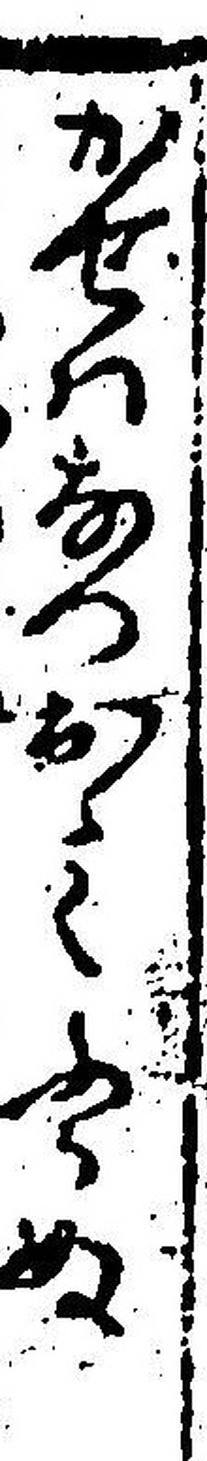かせはなつおゝくふかぬ
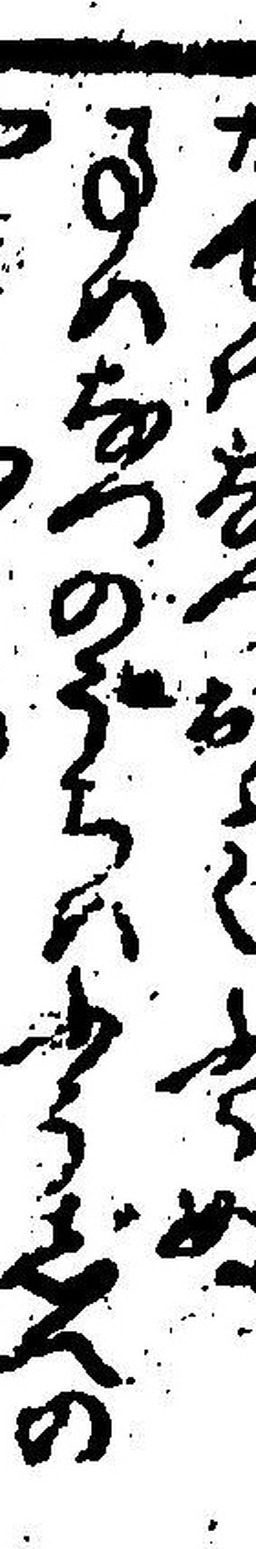事はなつのうちはふうじんの
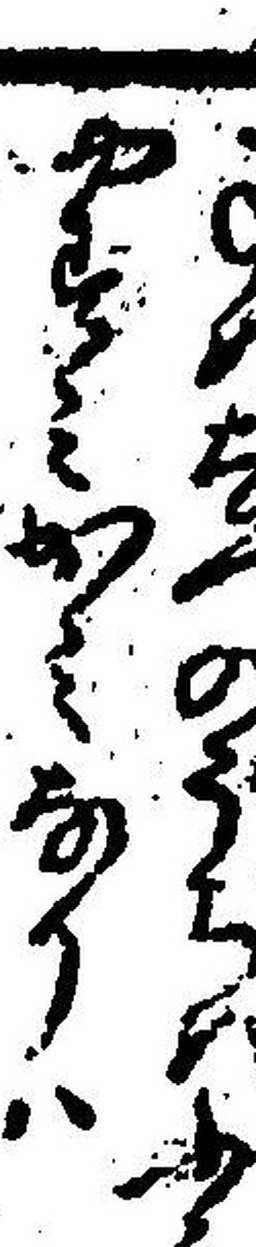やすみかみなりは
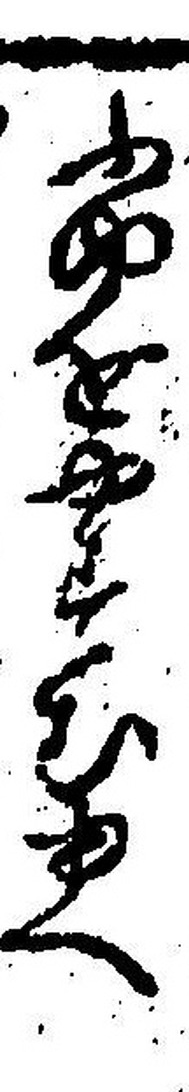ふゆをやすむゆへ
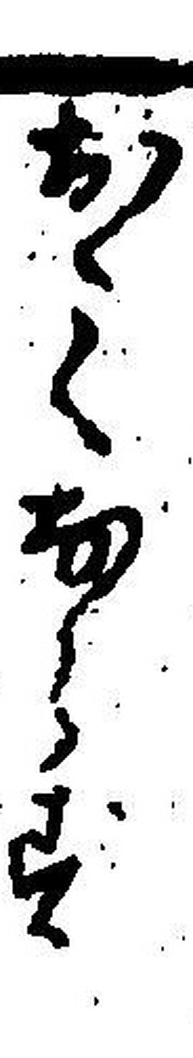おゝくならす
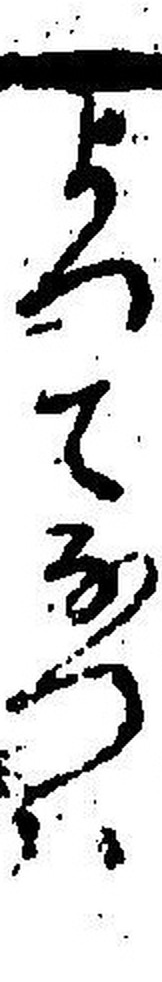よつてなつは
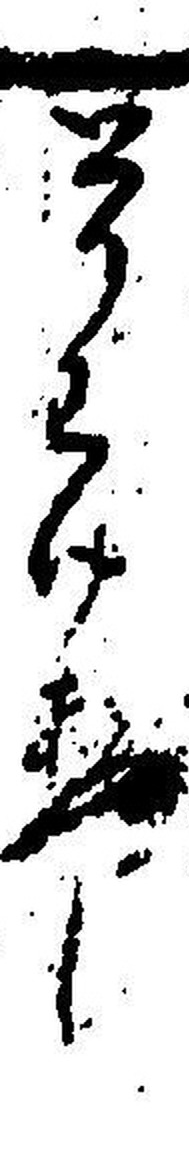とりわけあつし
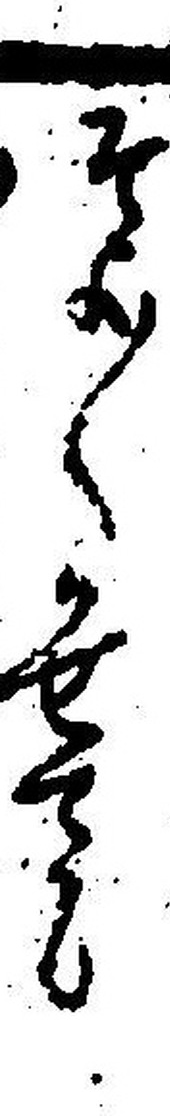そよ〳〵かせても
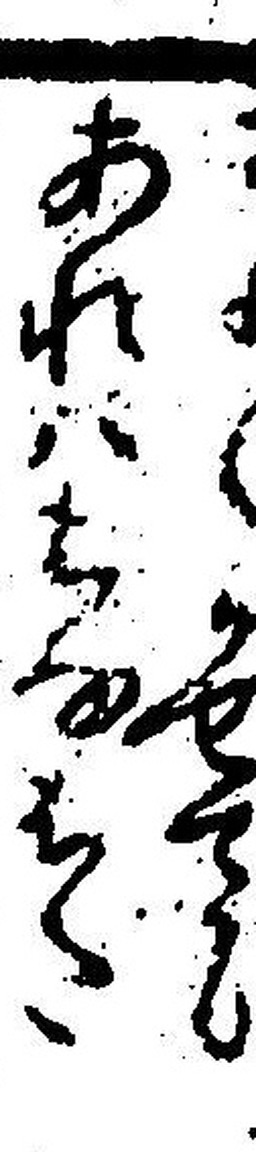あれははなはた
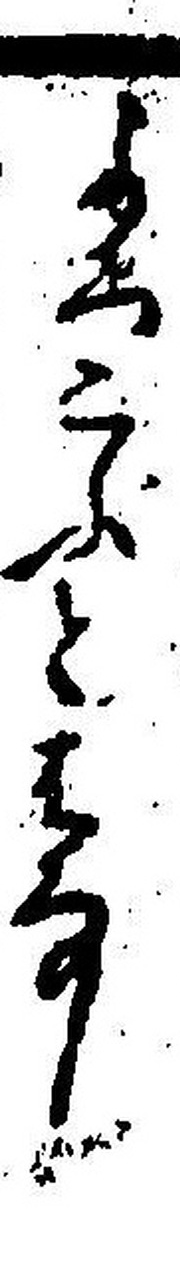よろこふとはなし
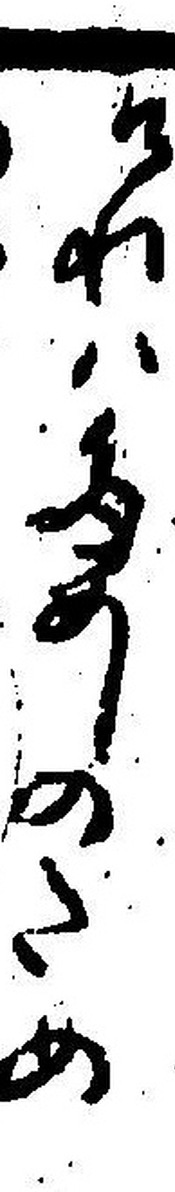けれはためしのため
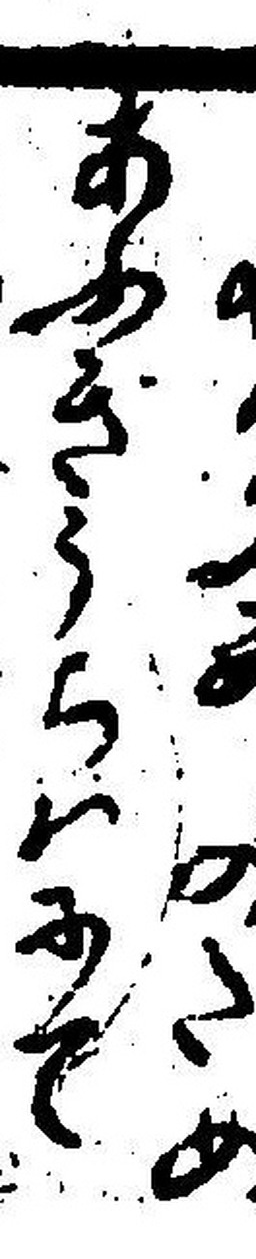あふきうちはにて
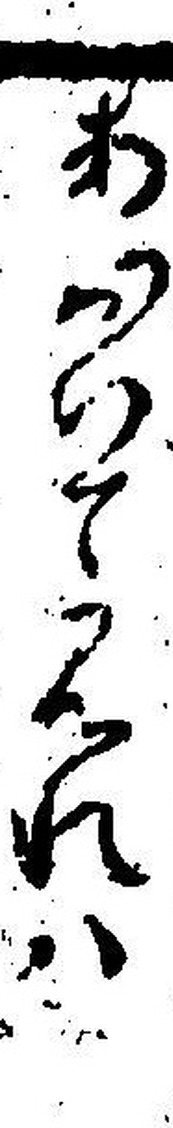あおいてみれは
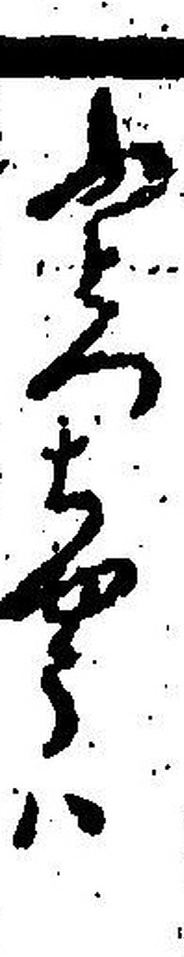ふとついやうは
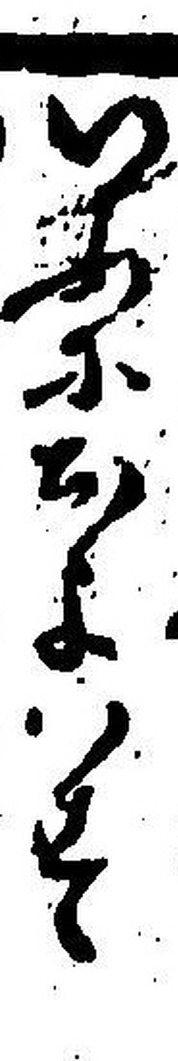いふにおよはす
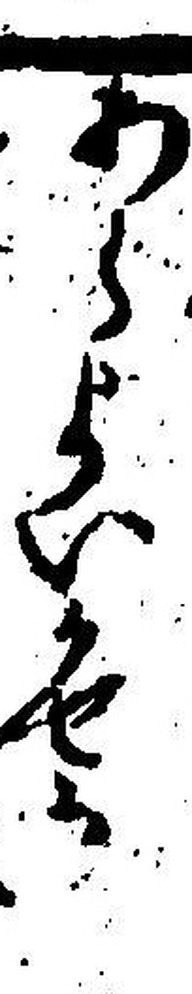あらよいかせか
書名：牡丹餅棚有 / 市場通笑作
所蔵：東京大学総合図書館 General Library in the University of Tokyo, JAPAN
